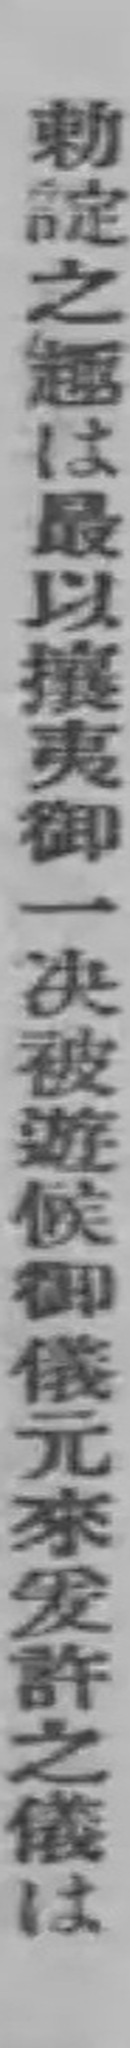勅諚之趣は最以攘夷御一決被遊候御儀元来爰許之儀は
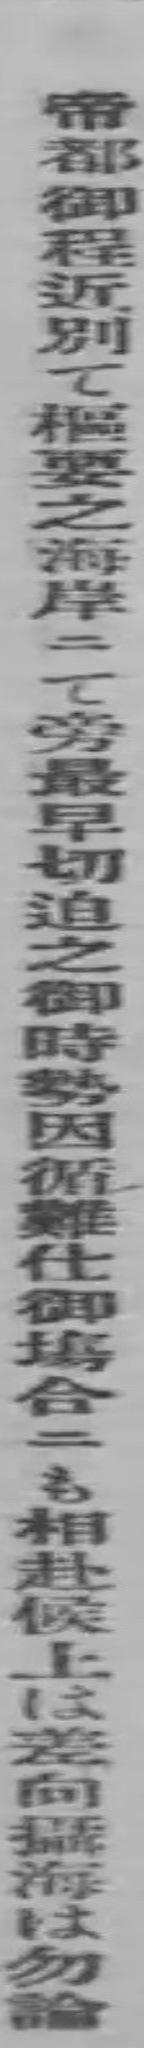帝都御程近別て枢要之海岸ニて旁最早切迫之御時勢因循難仕御場合ニも相赴候上は差向摂海は勿論
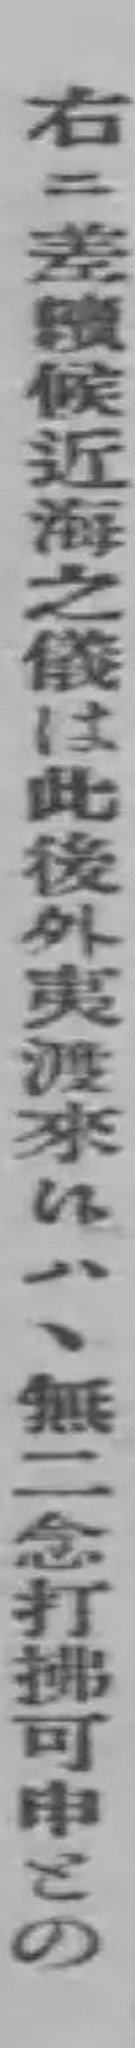右ニ差積候近海之儀は此後外夷渡来候ハヽ無二念打払可申との
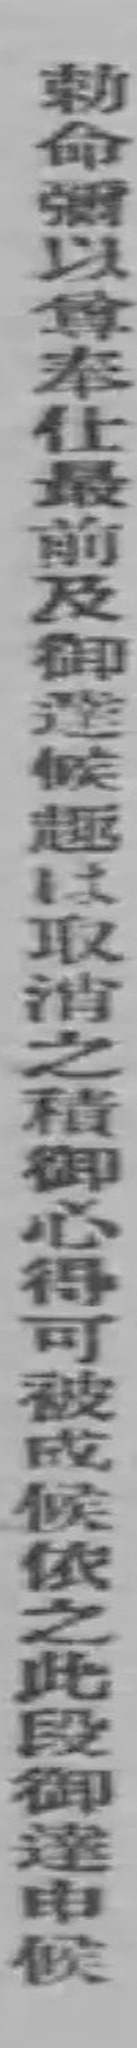勅命彌以尊奉仕最前及御達候趣は取消之積御心得可被成候依之此段御達申候
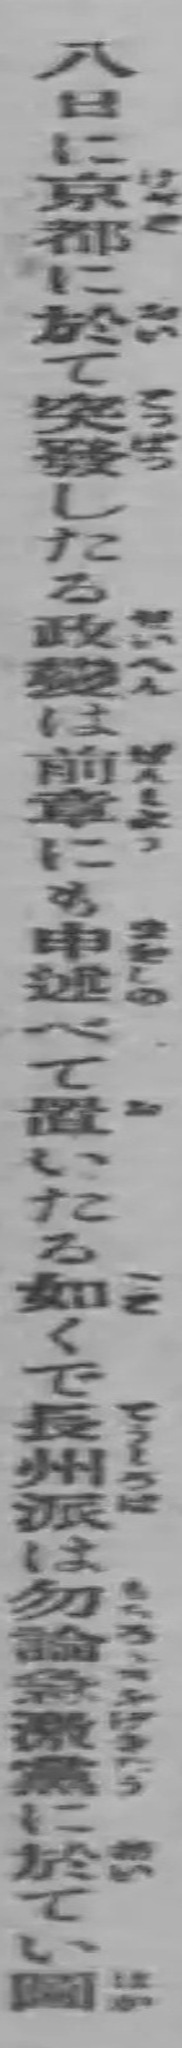八日に京都に於て突発したる政変は前章にも申述べて置いたる如くで長州派は勿論急激党に於てい図

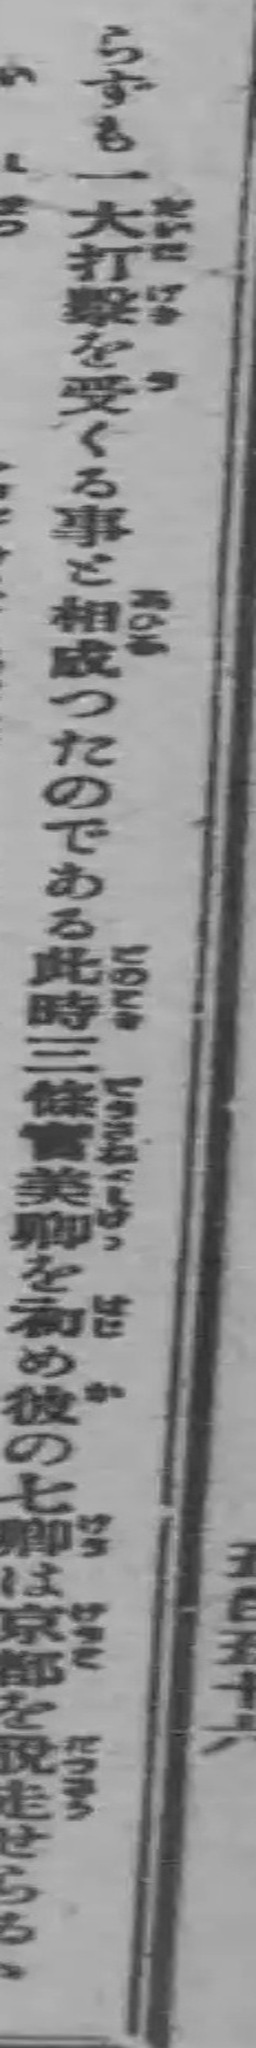らずも一大打撃を受くる事と相成つたのである此時三條実美卿を初め彼の七卿は京都を脱走せらるゝ
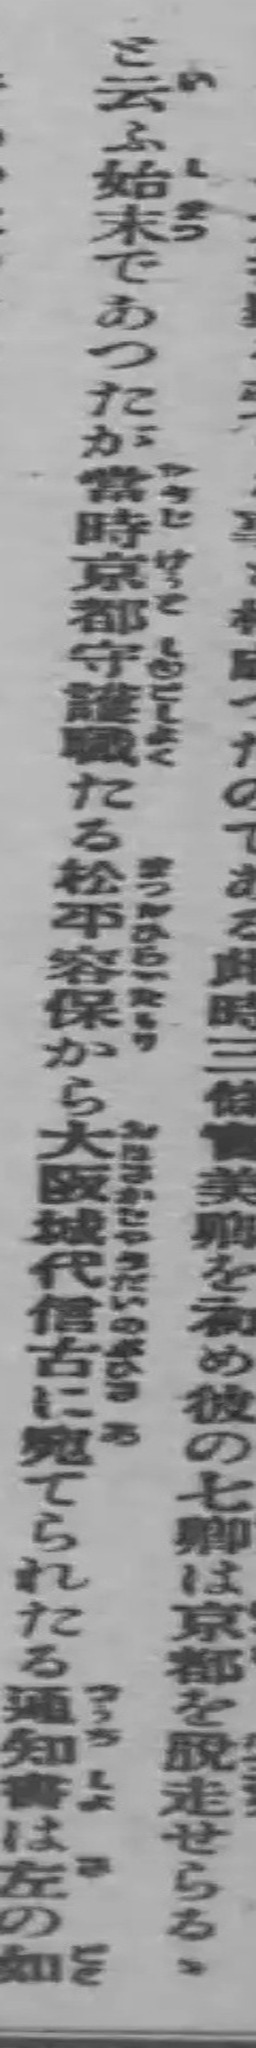と云ふ始末であつたが当時京都守護職たる松平容保から大阪城代信古に宛てられたる通知書は左の如
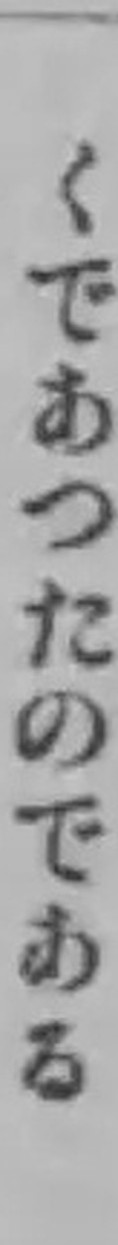くであつたのである
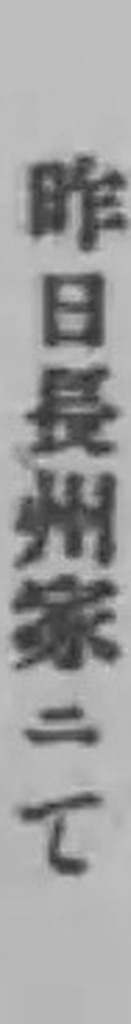昨日長州家ニて
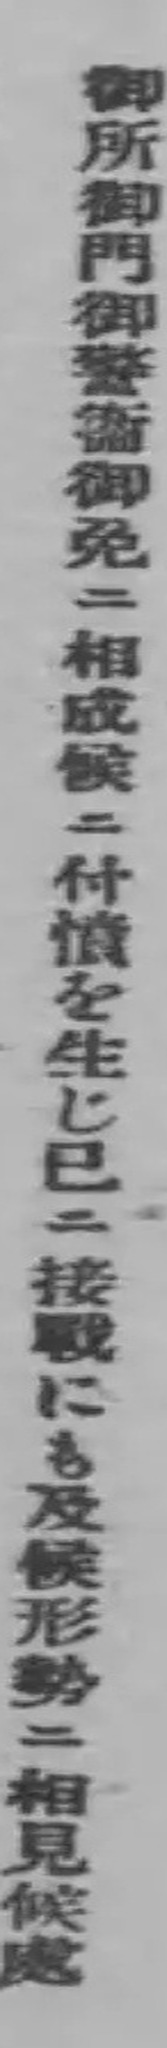御所御門御警衛御免ニ相成候ニ付憤を生じ已ニ接戦にも及候形勢ニ相見候処
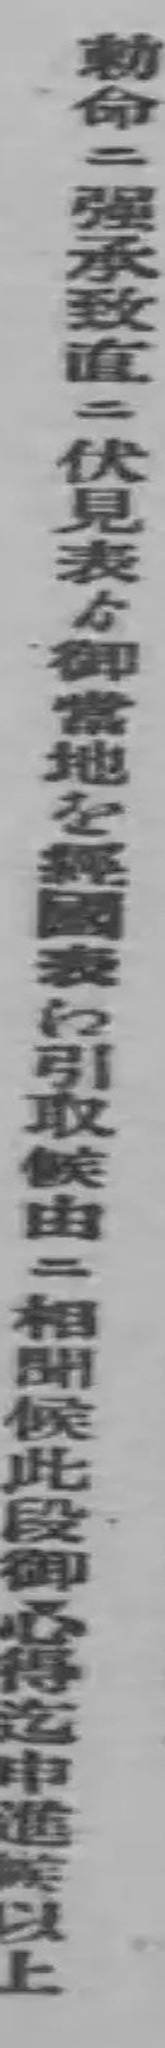勅命ニ強承致直ニ伏見表ゟ御当地を経国表え引取候由ニ相聞候此段御心得迄申進候以上
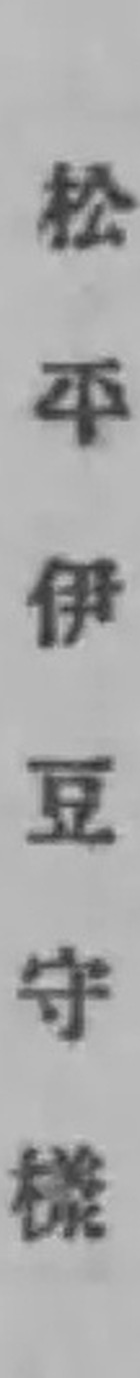松平伊豆守様
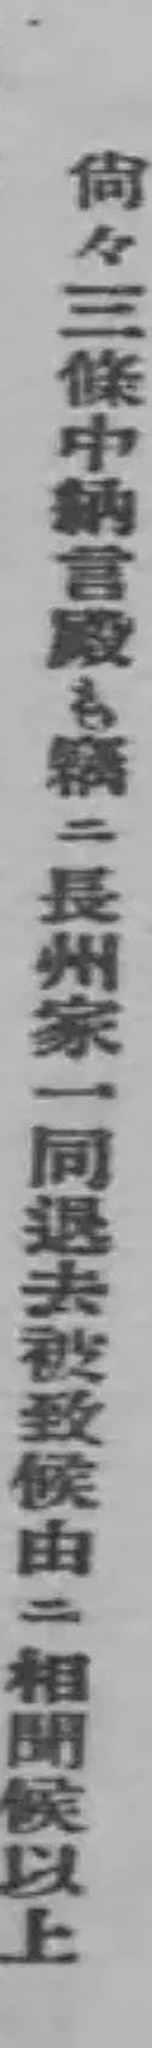尚々三條中納言殿も竊ニ長州家一同退去被致候由ニ相聞候以上
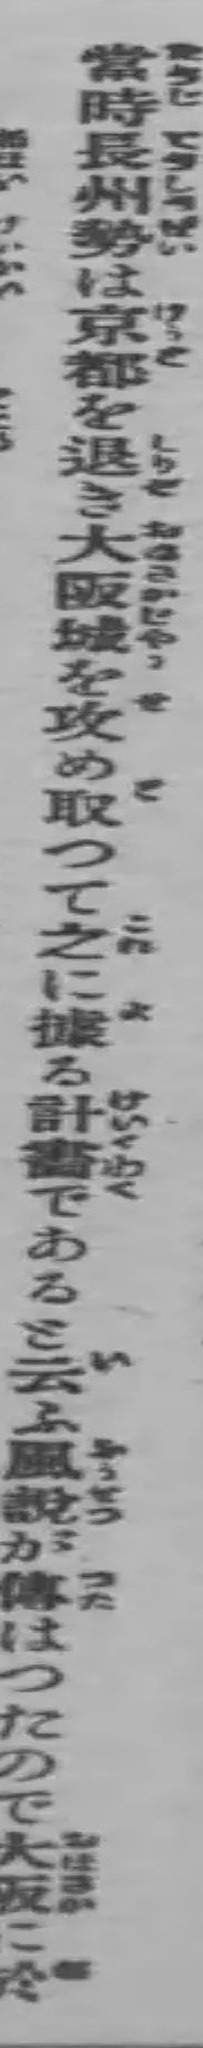当時長州勢は京都を退き大阪城を攻め取つて之に拠る計画であると云ふ風説が伝はつたので大阪に於
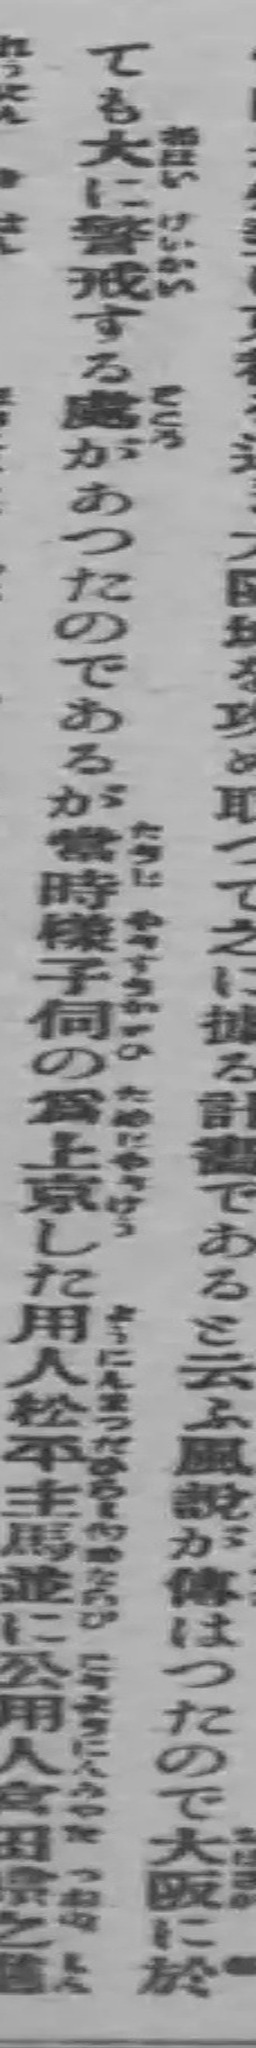ても大に警戒する処があつたのであるが当時様子伺の為上京した用人松平主馬並に公用人宮田鏆之進
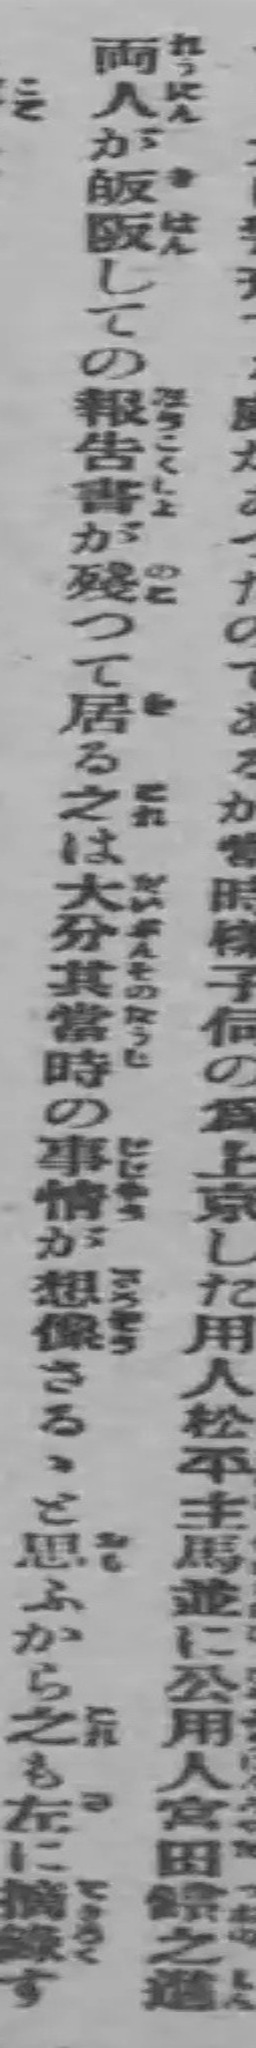両人が皈阪しての報告書が残つて居る之は大分其当時の事情が想像さるゝと思ふから之も左に摘録す
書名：豊橋市史談
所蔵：国立国会図書館 National Diet Library, JAPAN
